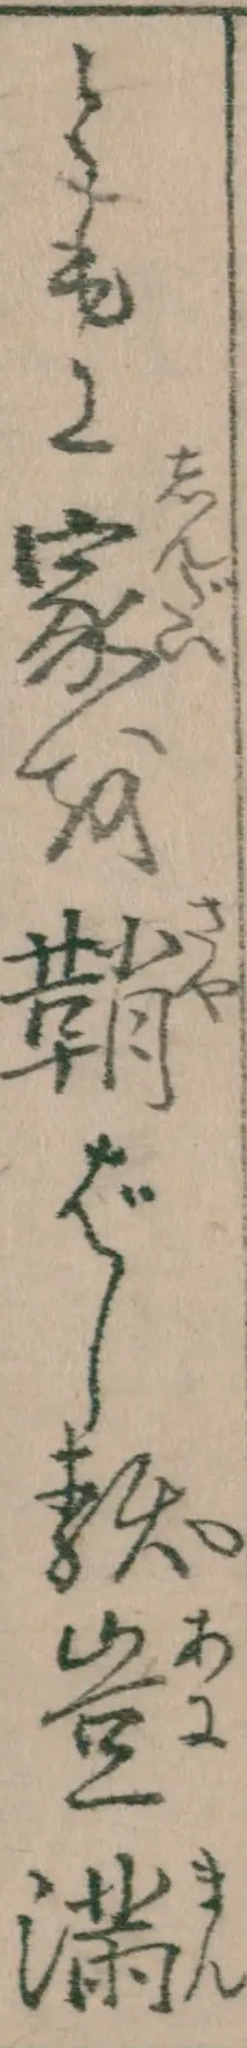ともに家を鞘ばしる。豈満
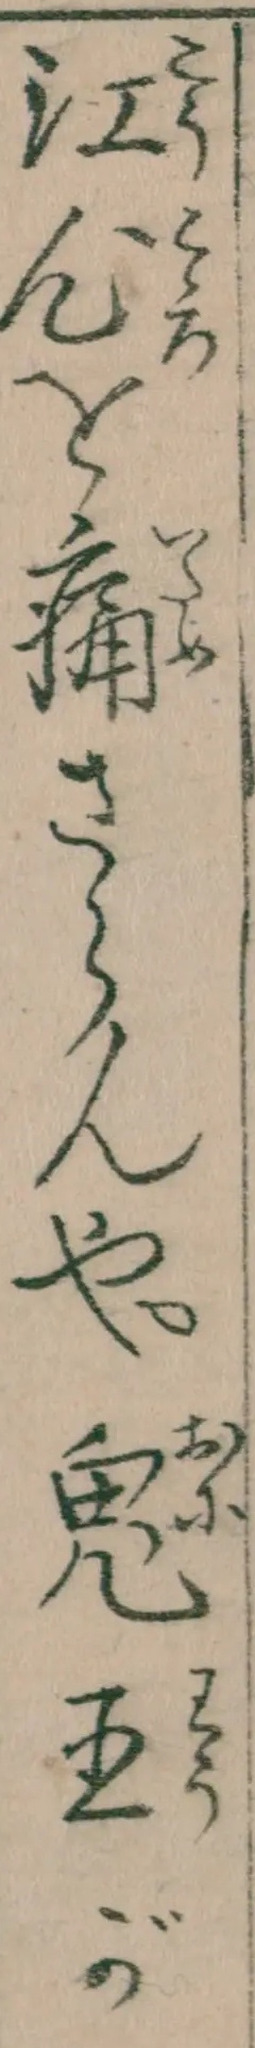江心を痛さらんや。鬼王が
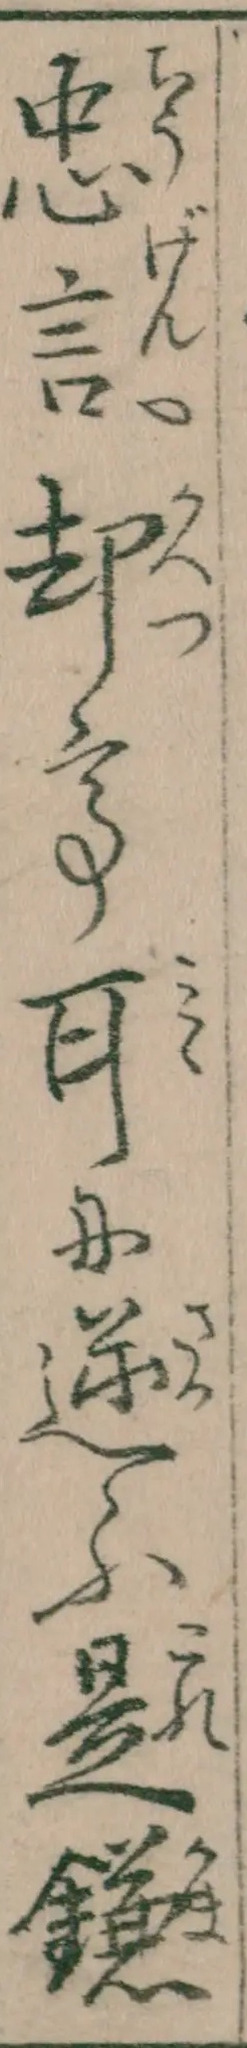忠言。却て耳に逆ふ是鎌
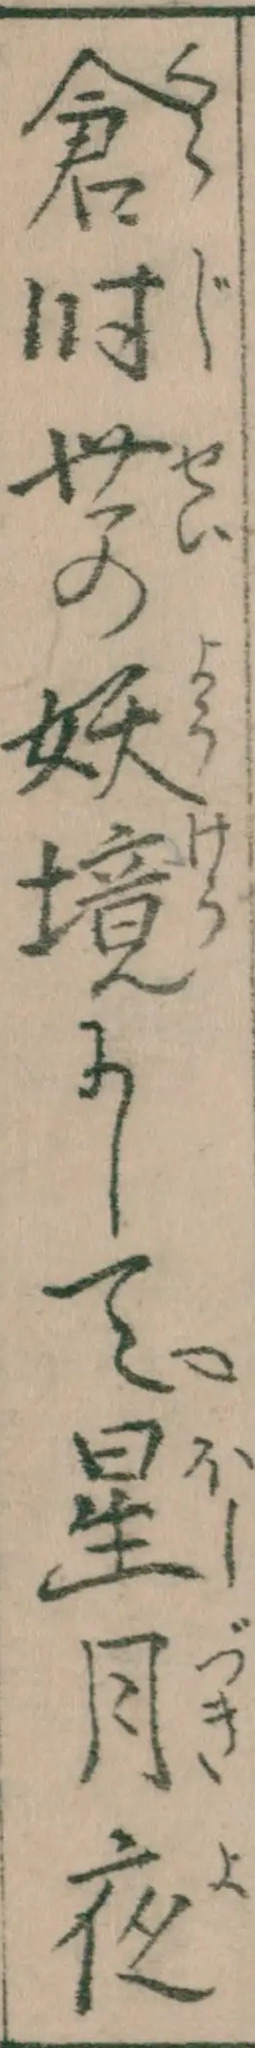倉時世の妖境にして。星月夜

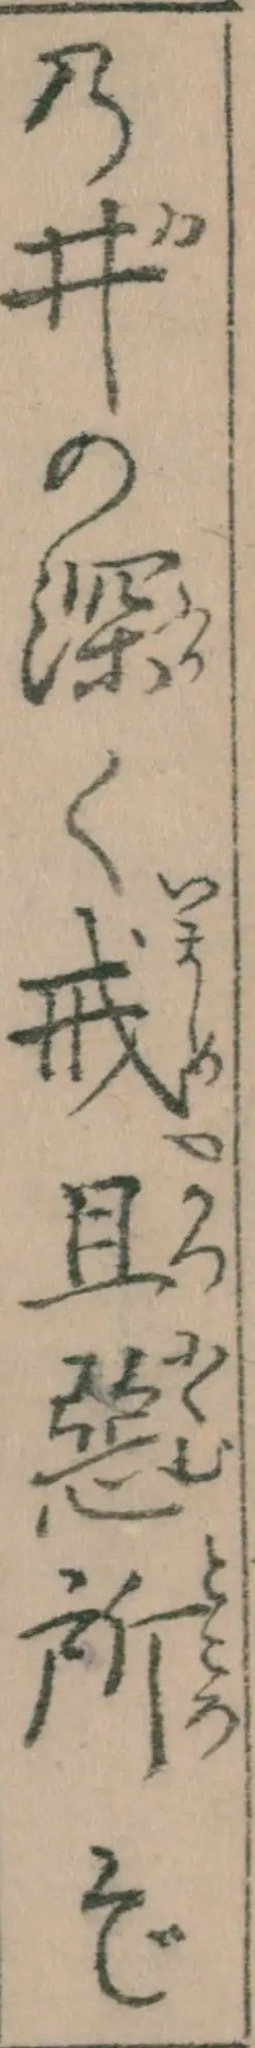の井の深く戒。且悪所ぞ
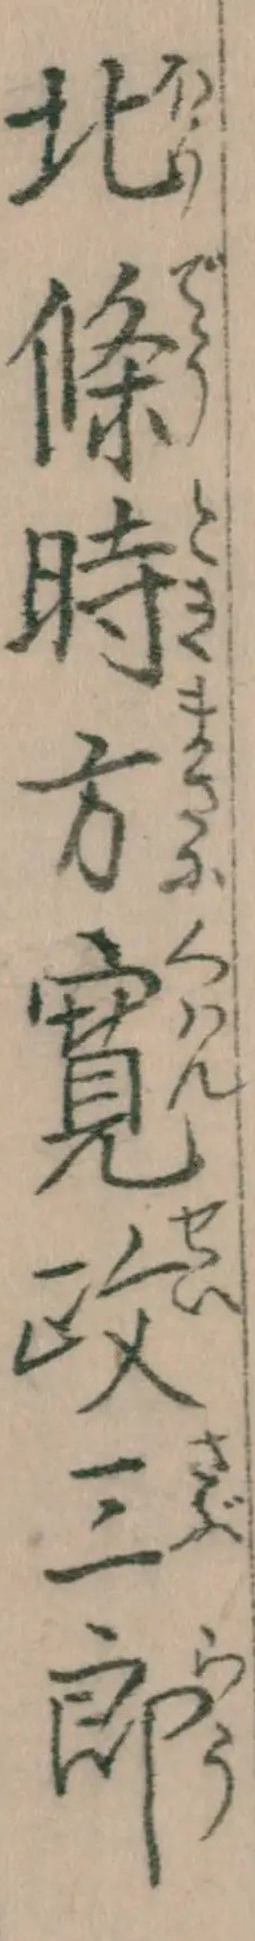北条時方寛政三郎
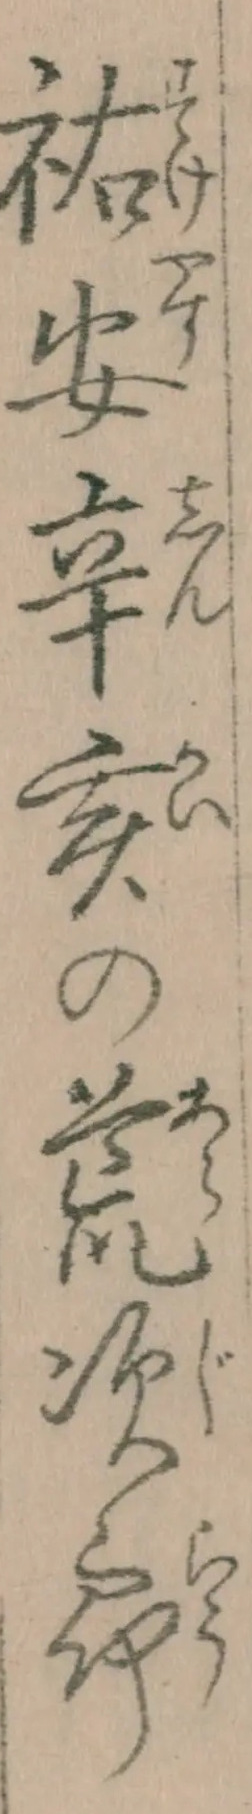祐安辛亥の荒次郎
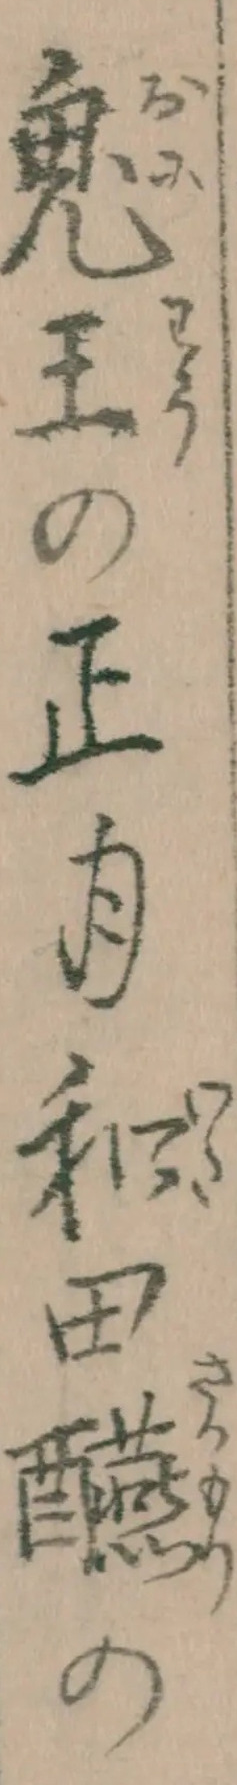鬼王の正月和田讌の
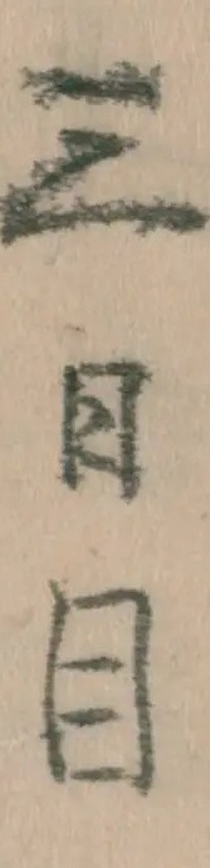三日目
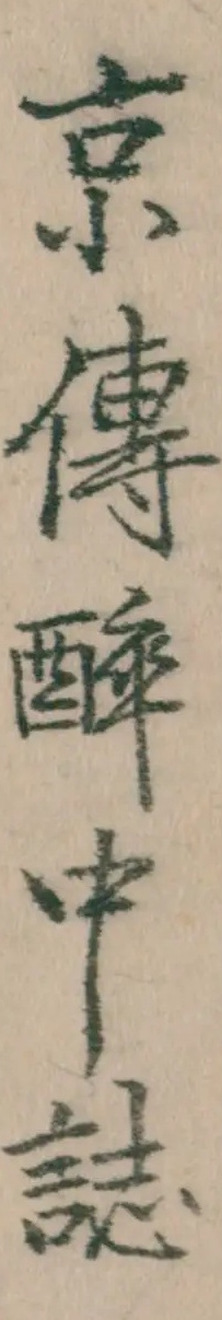京伝酔中誌

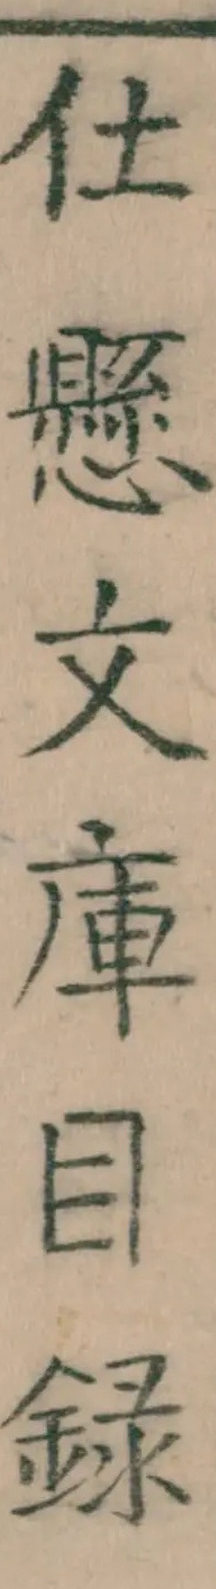仕懸文庫目録
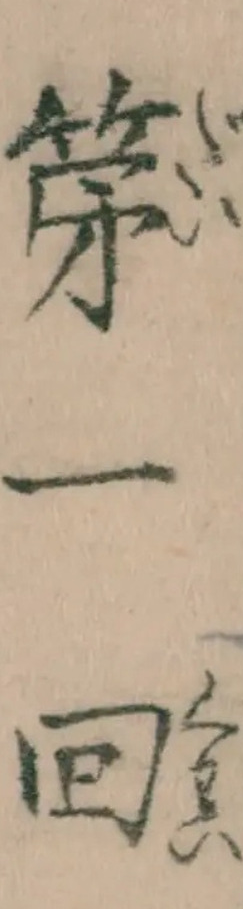第一回
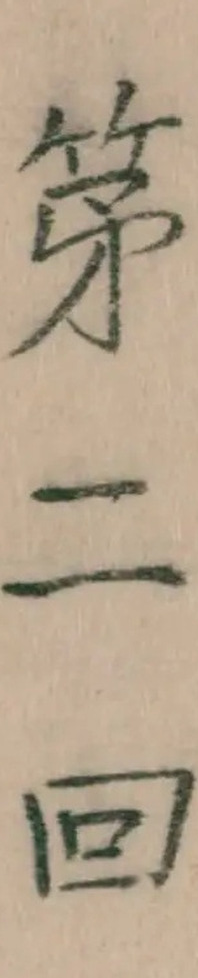第二回
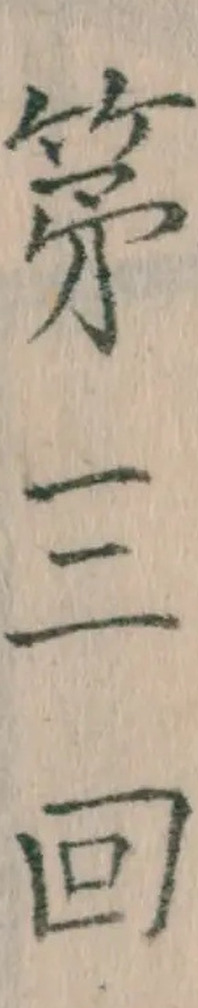第三回
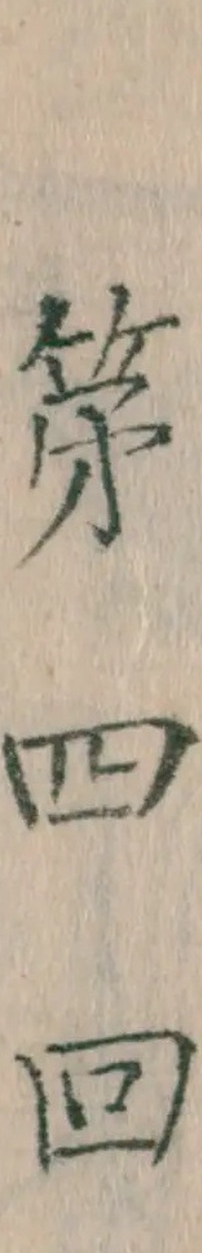第四回

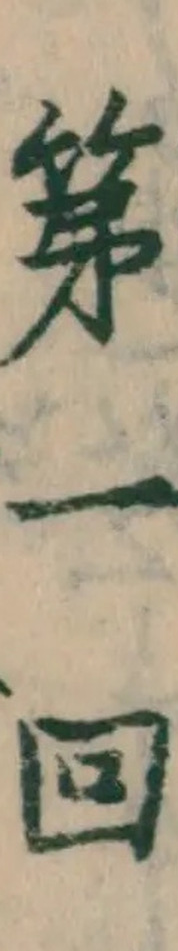第一回
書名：教訓読本：大礒風俗仕懸文庫
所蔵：国立国会図書館 National Diet Library, JAPAN
